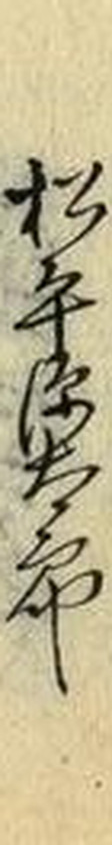松平源太郎
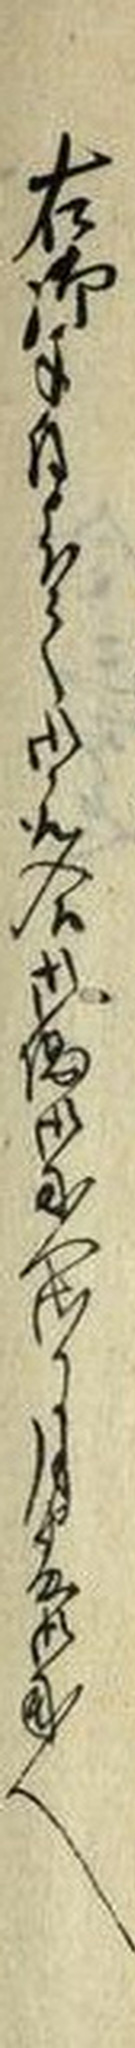右御手自被下之御取合御側御用人代り月番御用人
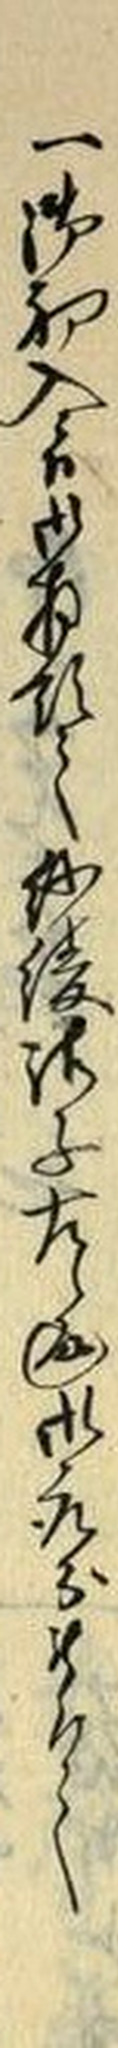一御初入ニ付御拝領之紗綾銀子左之通御取分被下之
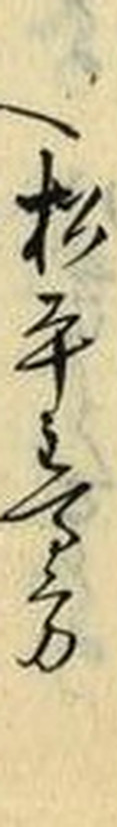松平主馬方
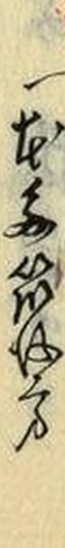本多筑後方
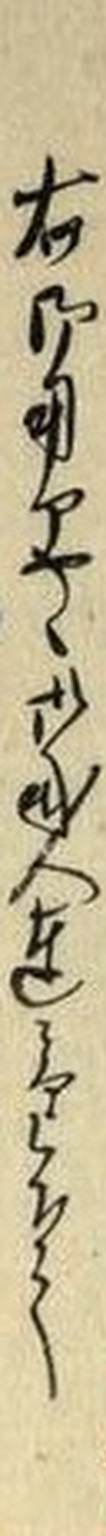右御用部やへ御用人達ニ而被下之
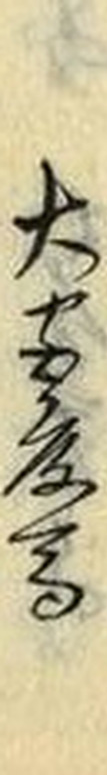煩大宮籐馬
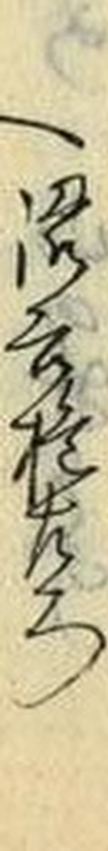渋谷権左衛門
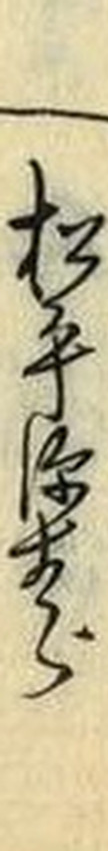松平源太郎
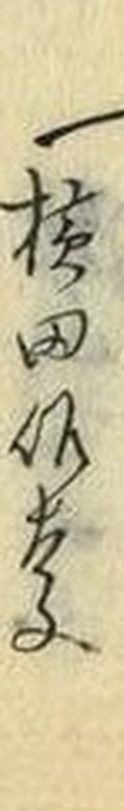横田作太夫
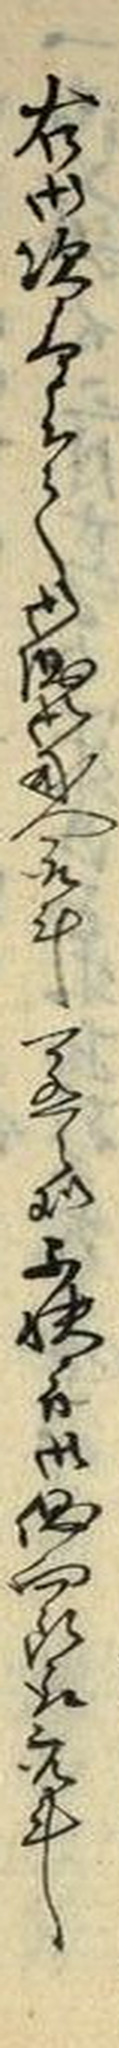右御次ニ而被下之御側御用人取斗可有候処不快ニ付御側向頭取取斗
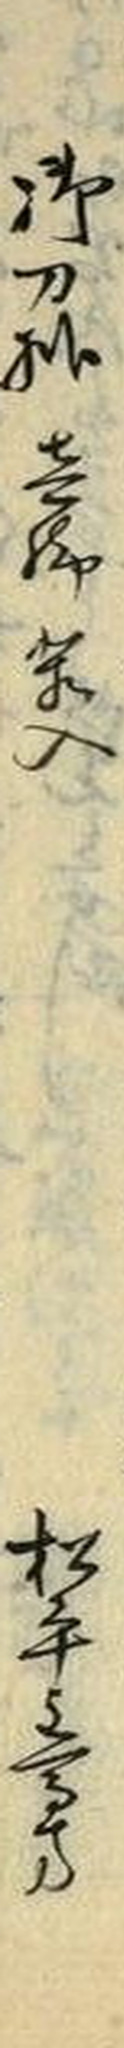御刀掛壱脚箱入松平主馬方
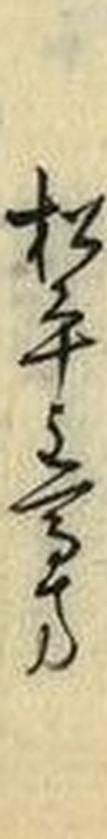松平主馬方
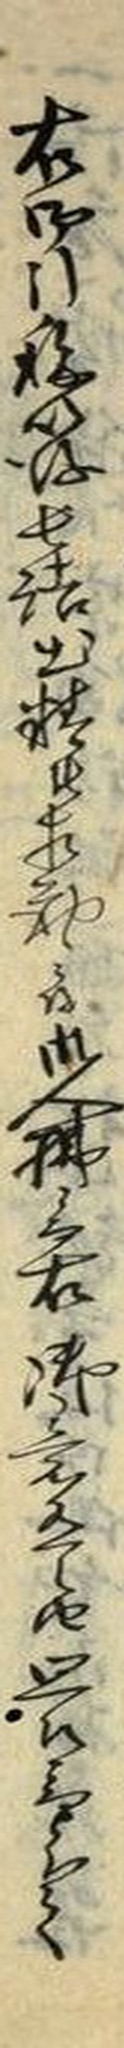右御引移以後長詰出精被相勤候ニ付御人払ニ而右御意有之由思召ニ而被下之
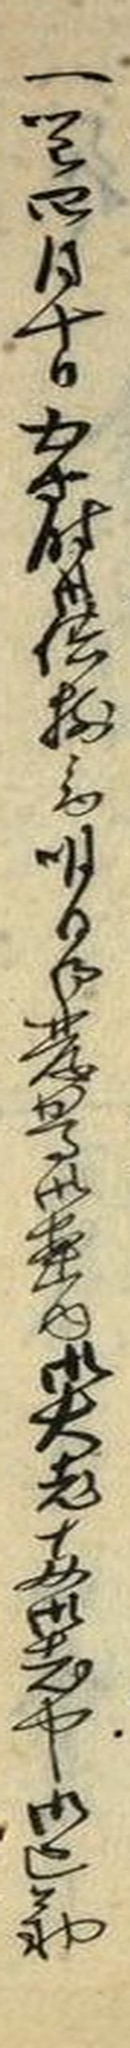一閏四月十日五半時御供揃ニ而明日御発駕御案内御大老両御老中御廻勤

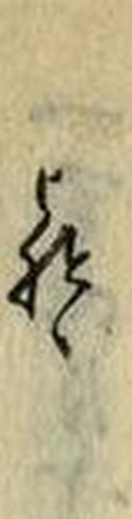被遊候
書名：少傅日録抄（斉善付側向頭取日記、江戸并道中、初入在国、逝去後…
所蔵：福井県文書館 Fukui Prefectural Archives
